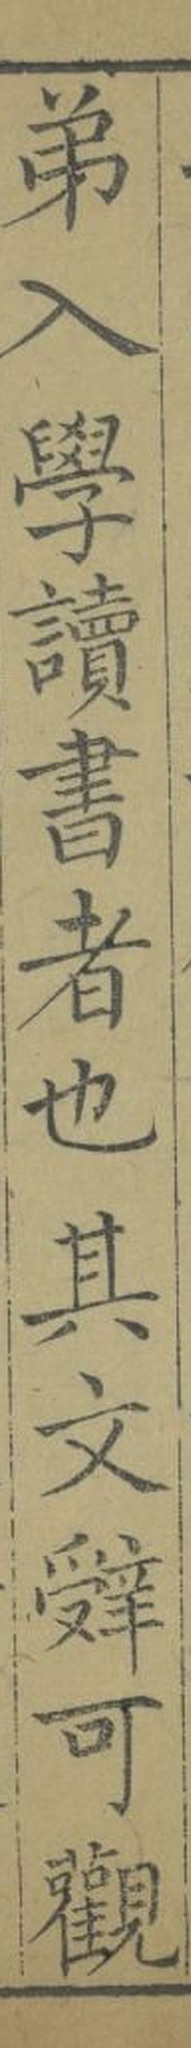弟入學讀書者也其文辤可觀
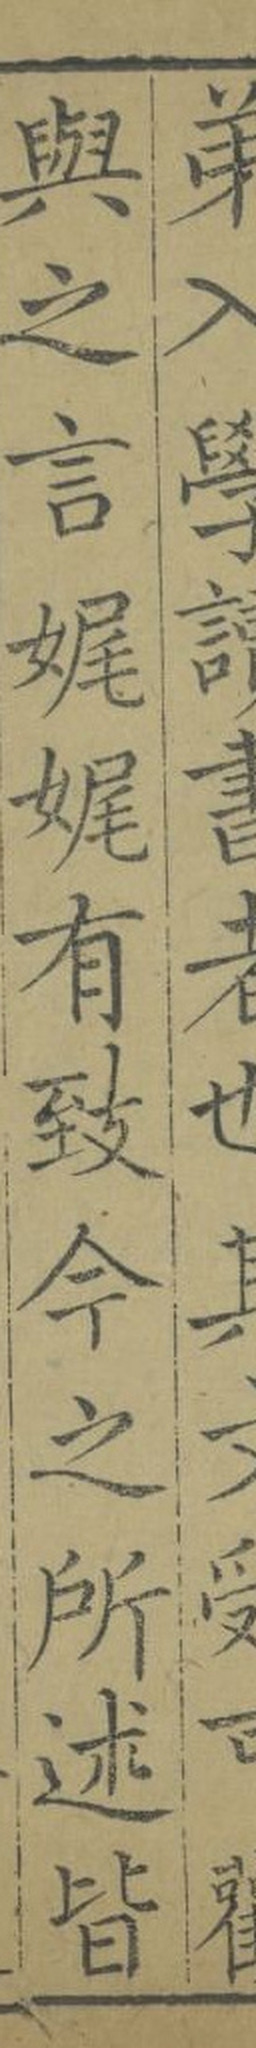與之言娓娓有致今之所述皆
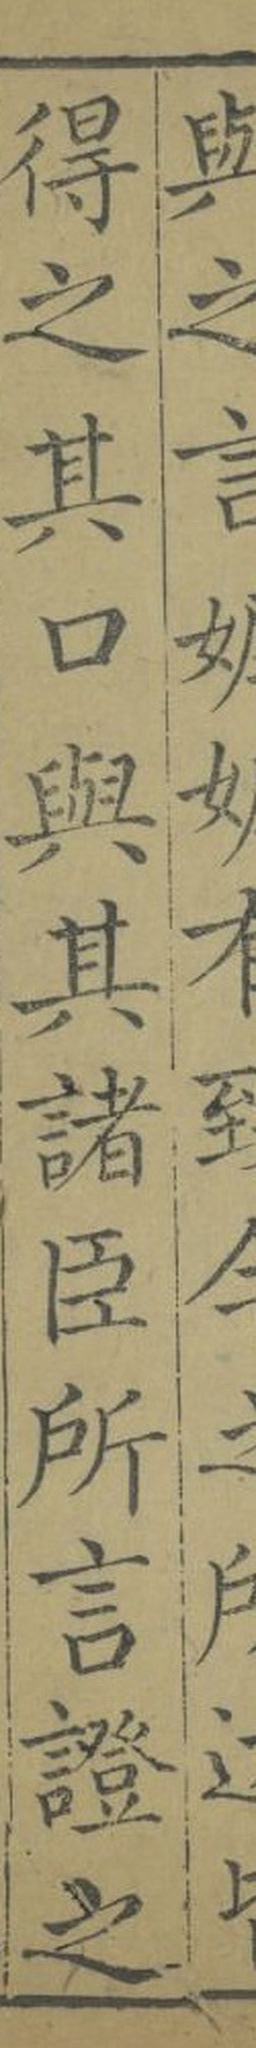得之其口與其諸臣所言證之
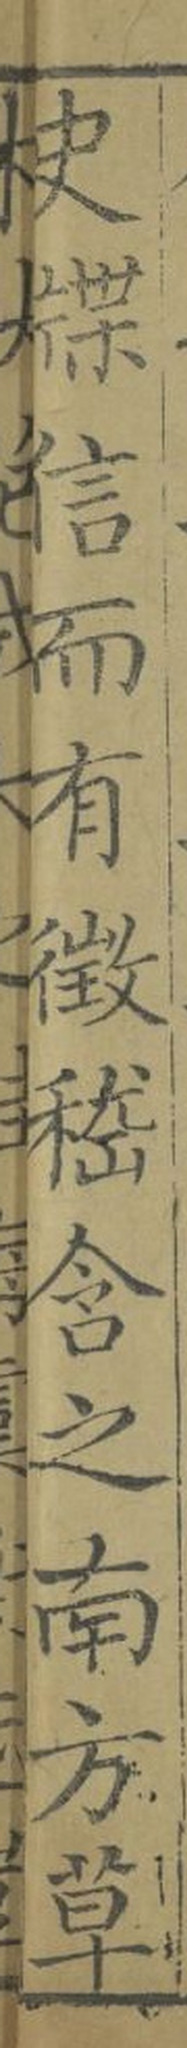史牒信而有徴嵇含之南方草
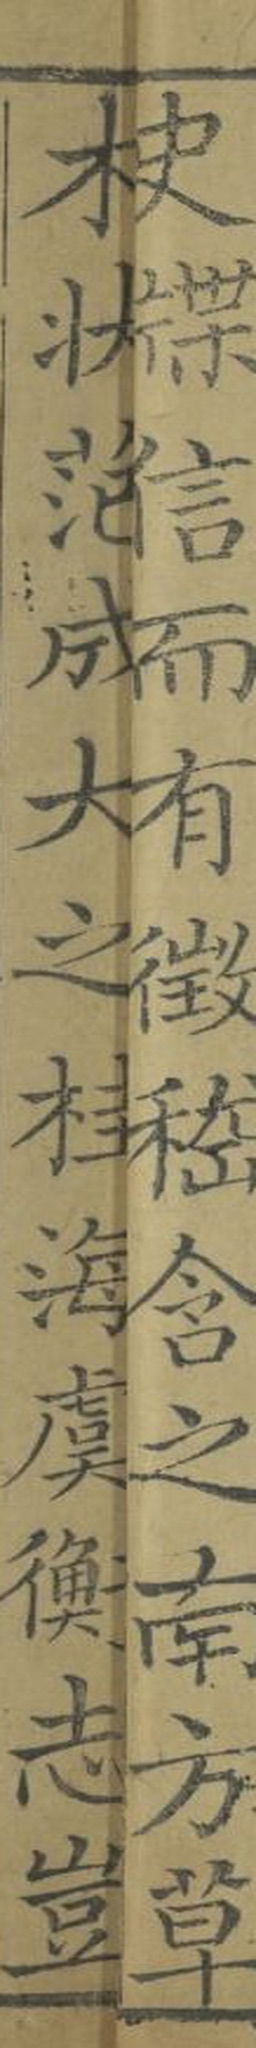木状范成大之桂海虞衡志豈
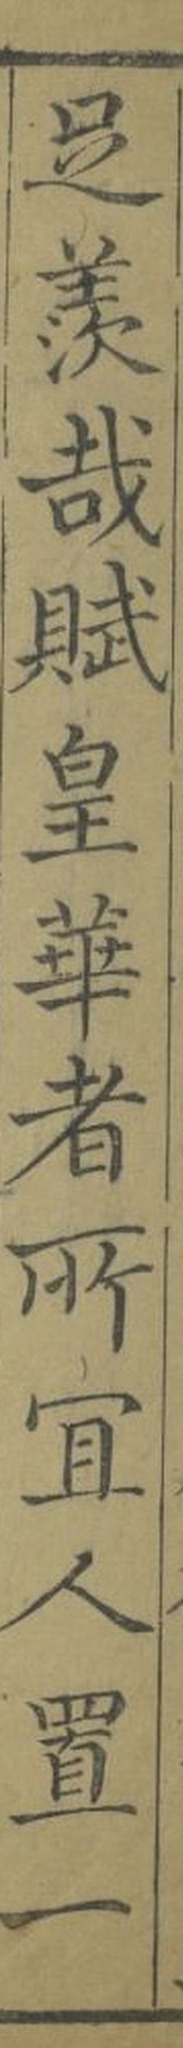足羡哉賦皇華者所冝人置一
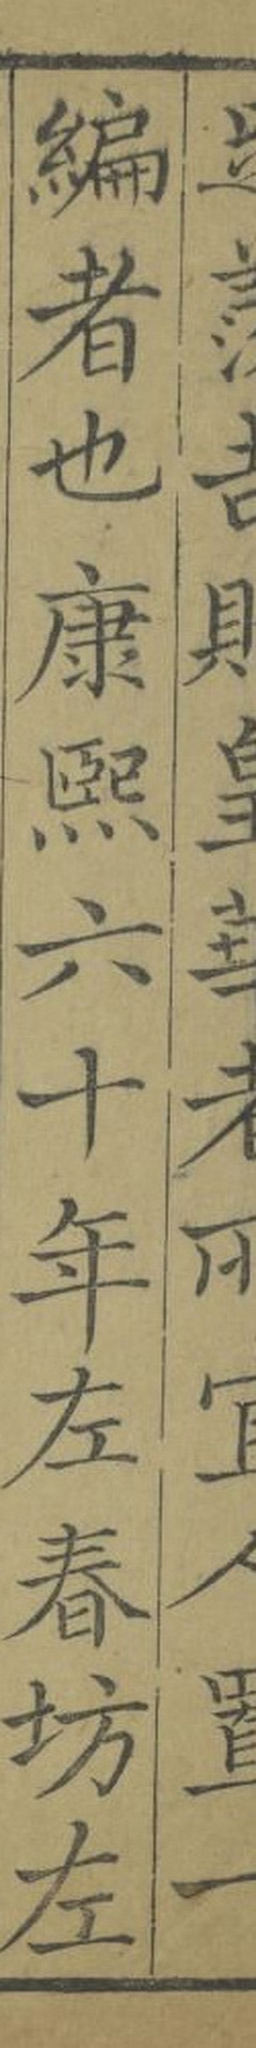編者也康熙六十年左春坊左
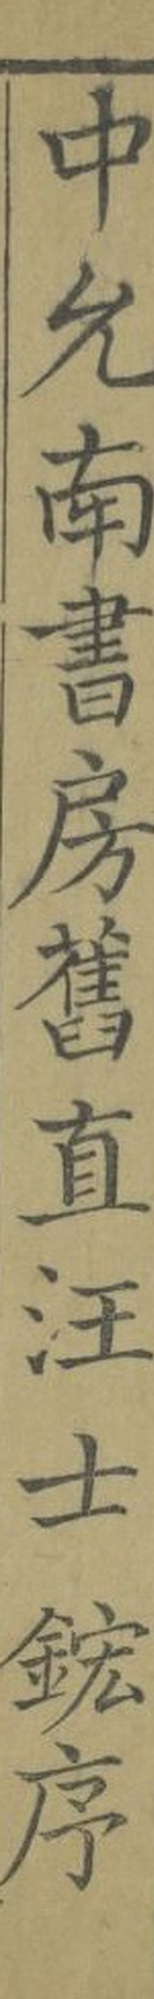中允南書房舊直汪士鋐序

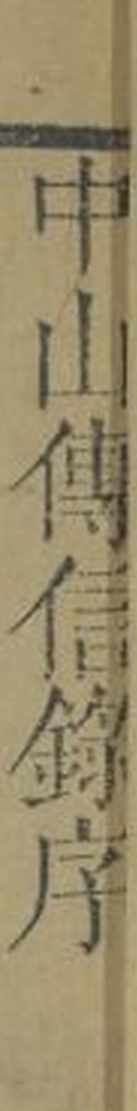中山傳信錄序
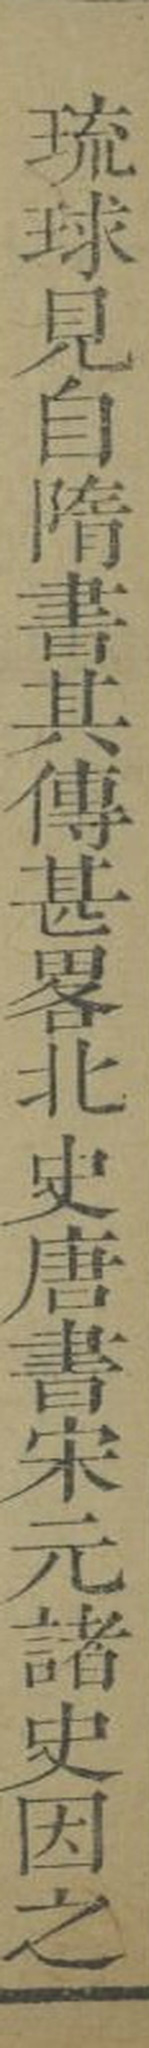琉球見自隋書其傳甚畧北史唐書宋元諸史因之
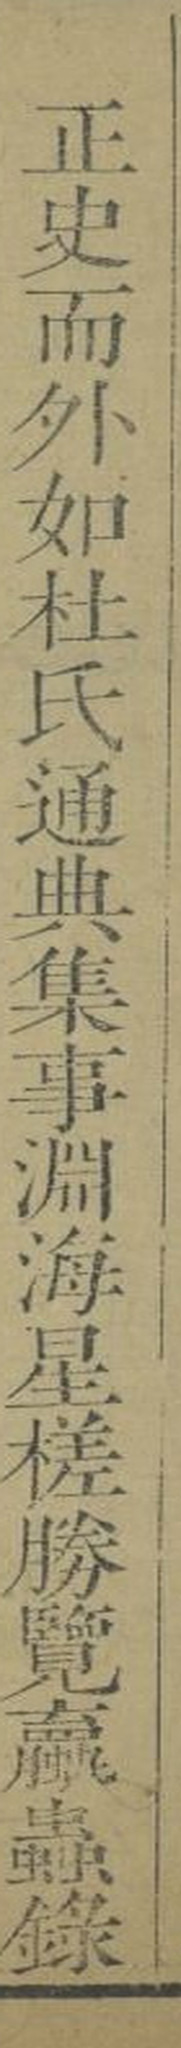正史而外如杜氏通典集事淵海星槎勝覽蠃蟲錄
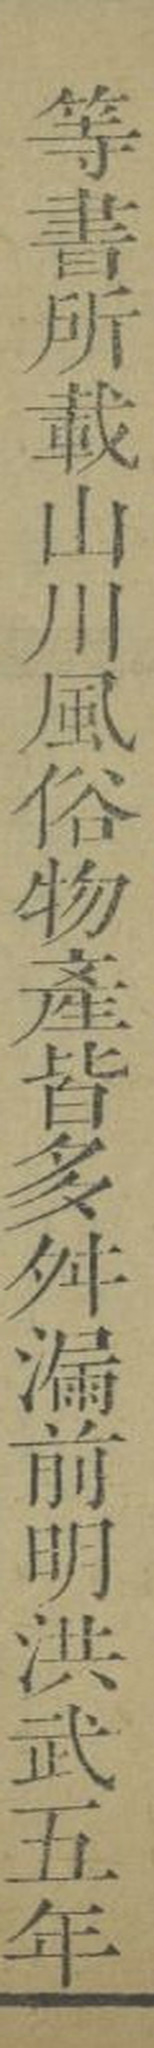等書所載山川風俗物產皆多舛漏前明洪武五年
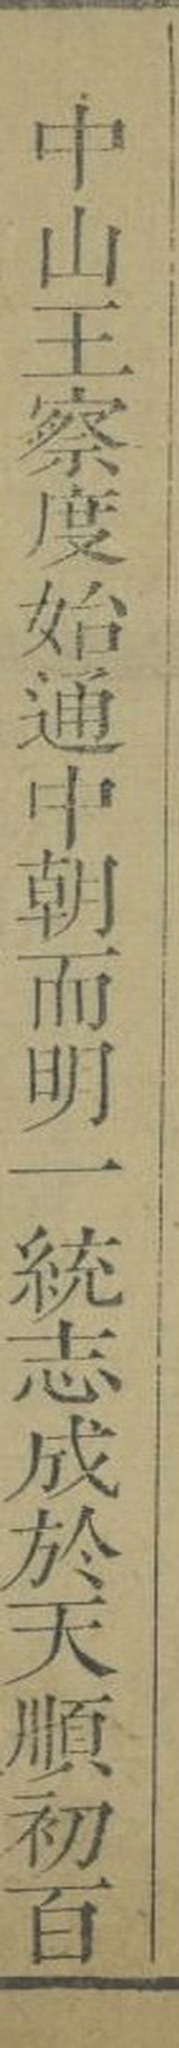中山王察度始通中朝而明一統志成於天順初百
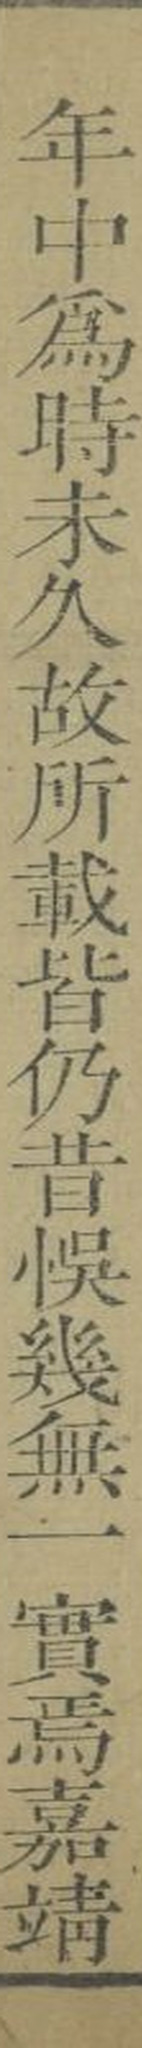年中爲時未久故所載皆仍昔悞幾無一實焉嘉靖
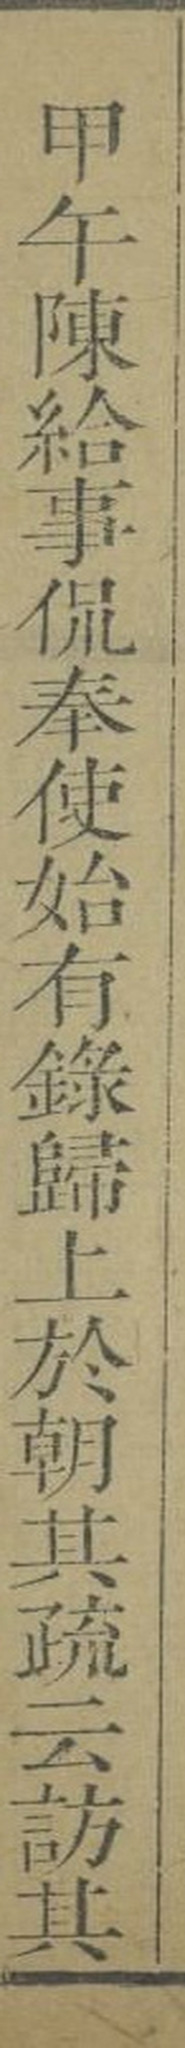甲午陳給事侃奉使始有錄歸上於朝其疏云訪其
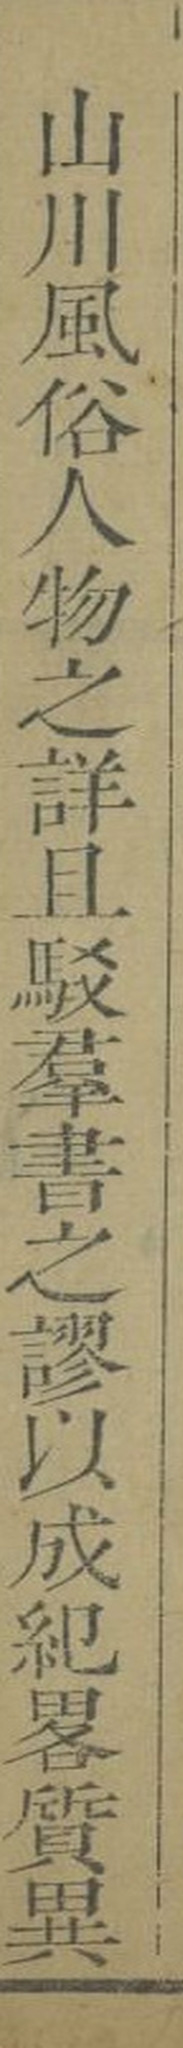山川風俗人物之詳且駁羣書之謬以成紀畧質異
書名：中山伝信録 巻一
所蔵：University of the Ryukyus Library
